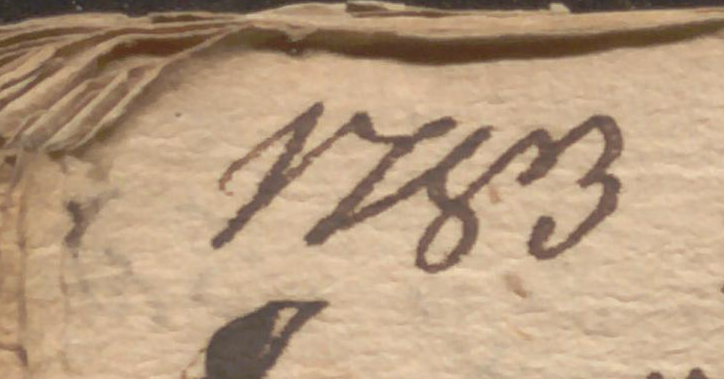1783
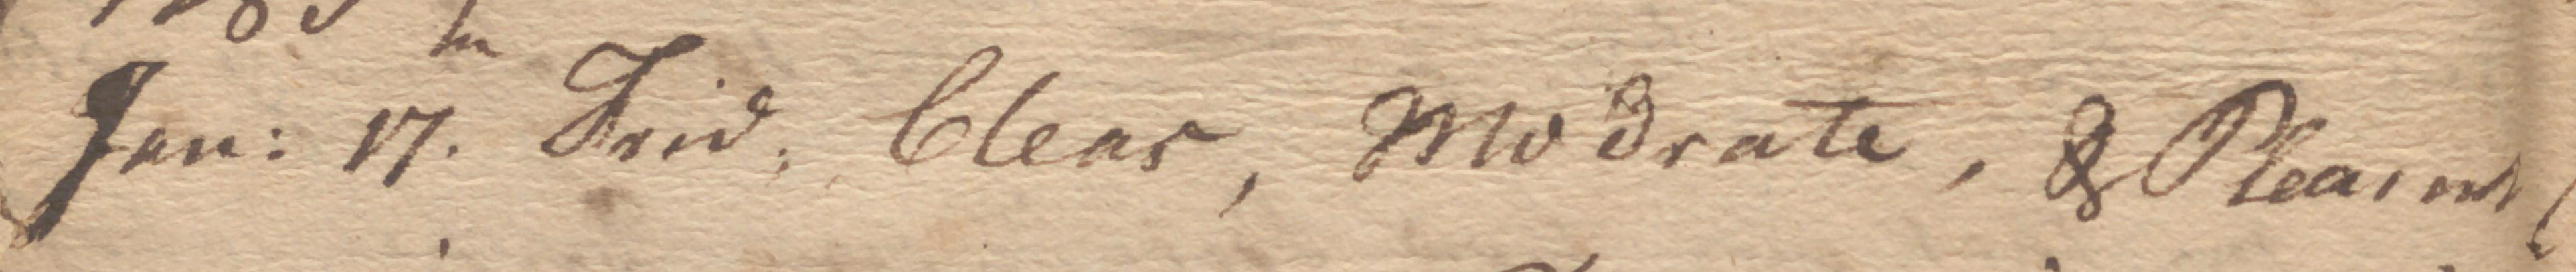Jan: 17^th. Frid. Clear, Modrate, & Pleasent
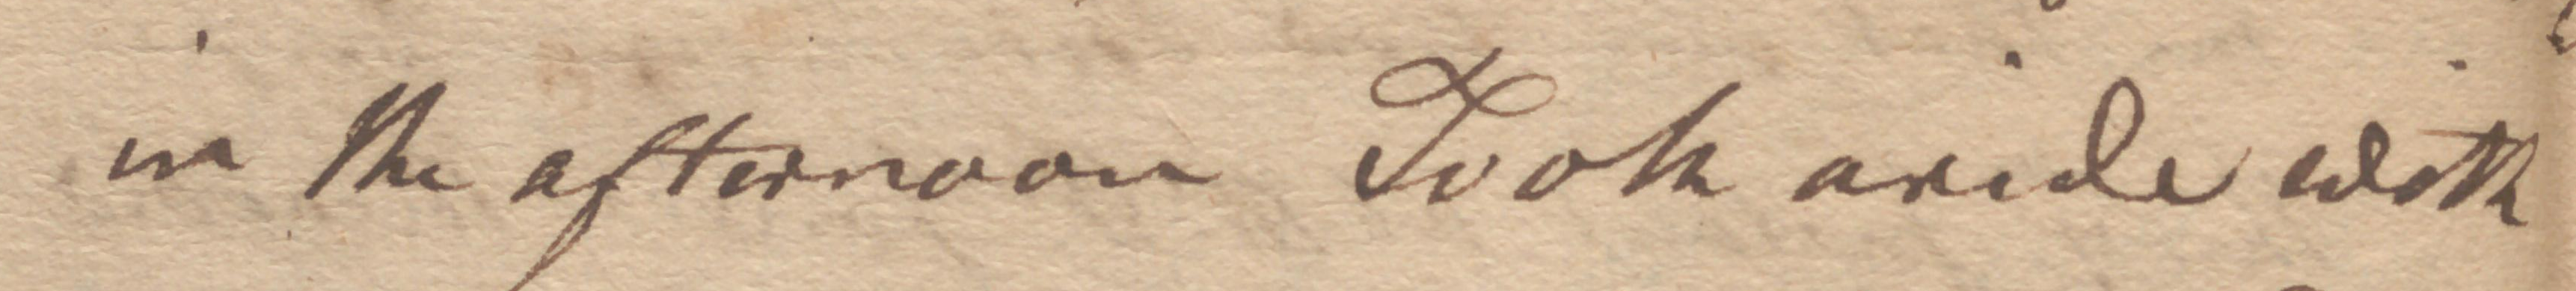in the afternoon Took a ride with
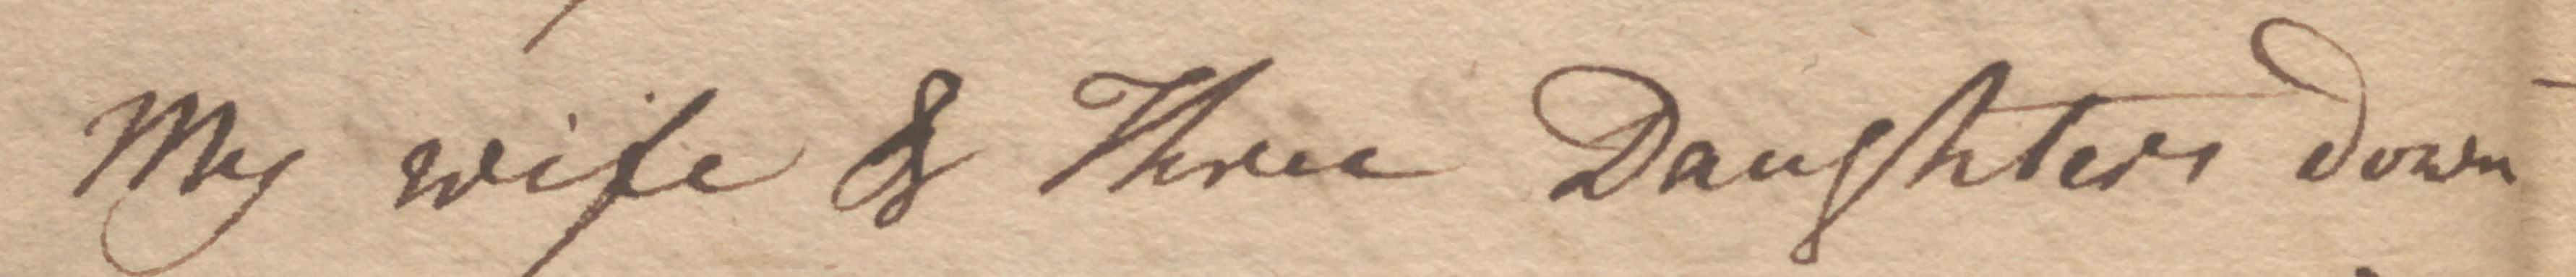My wife & Three Daughters down
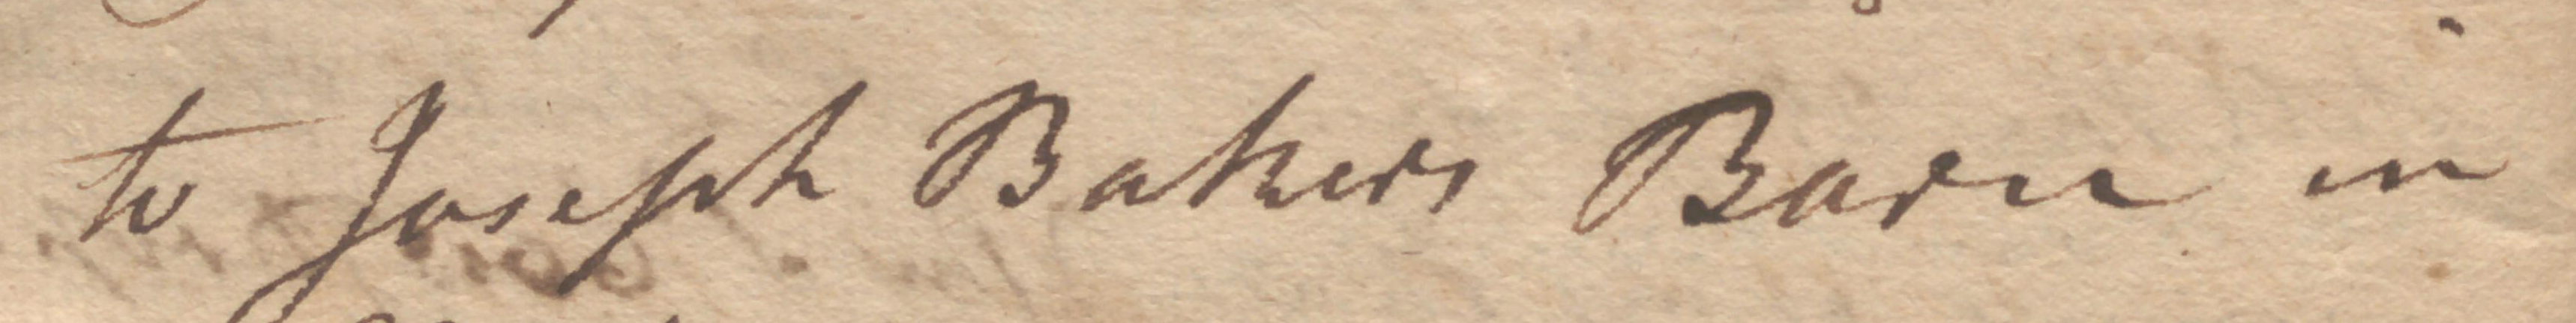to Joseph Bakers Barn in
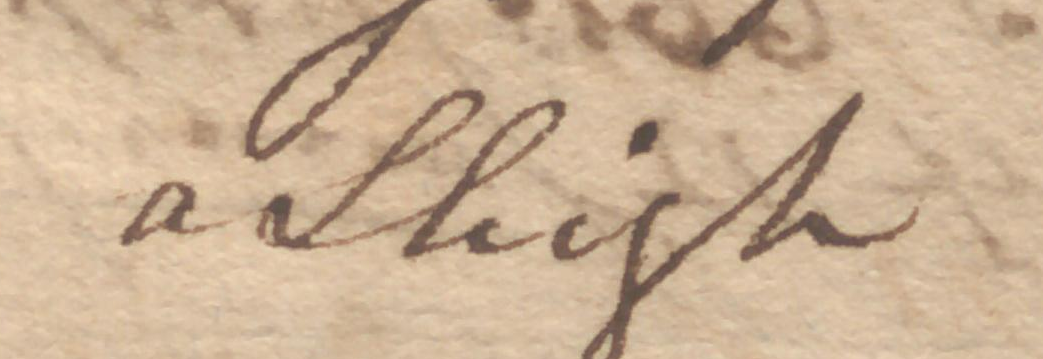a Sleigh
